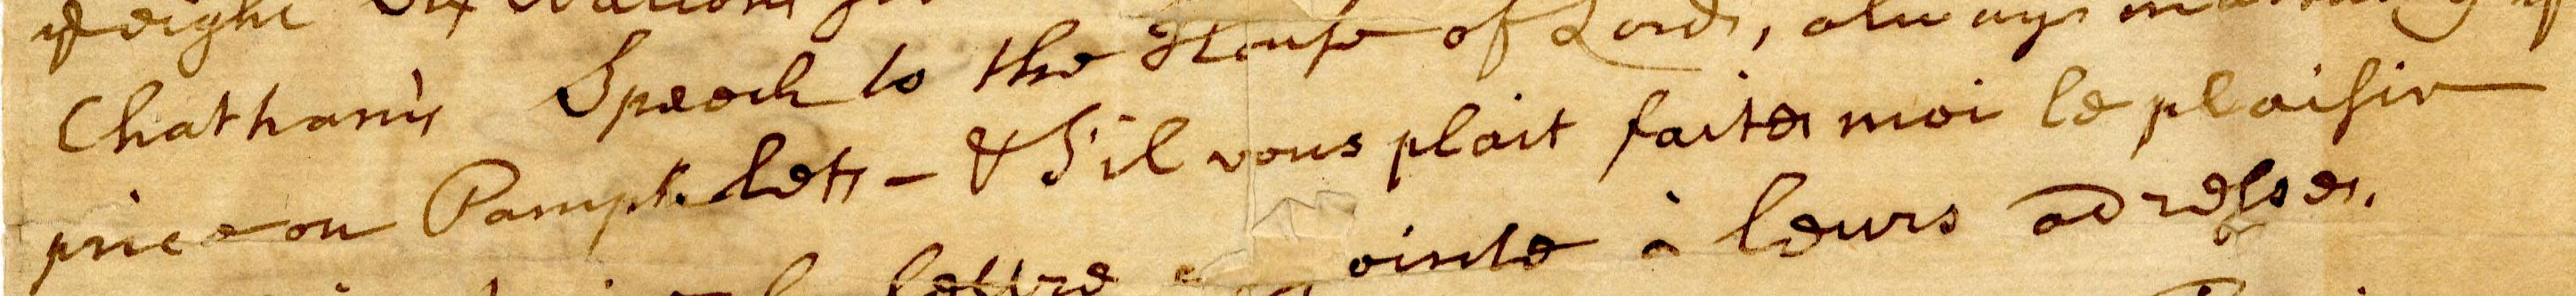price on Pamphlets- & Sil vous plait faite moi le plaisir
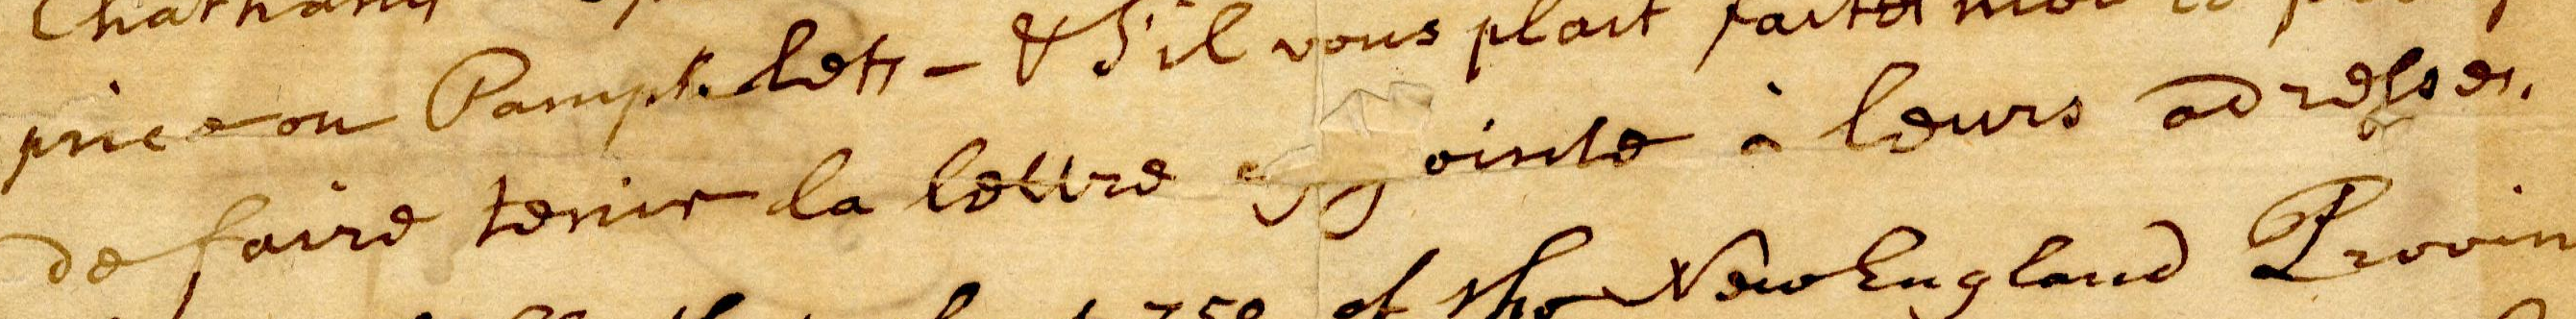de faire tenir la lettre [__], vinte a Cours adresses,
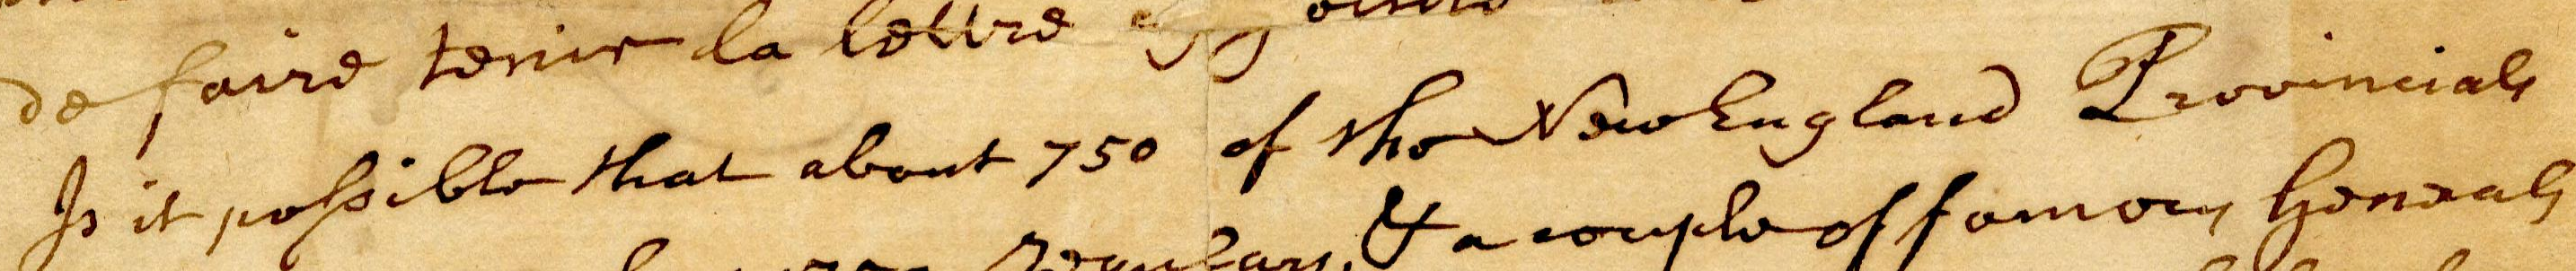Is it possible that about 750 of the New England Provincials
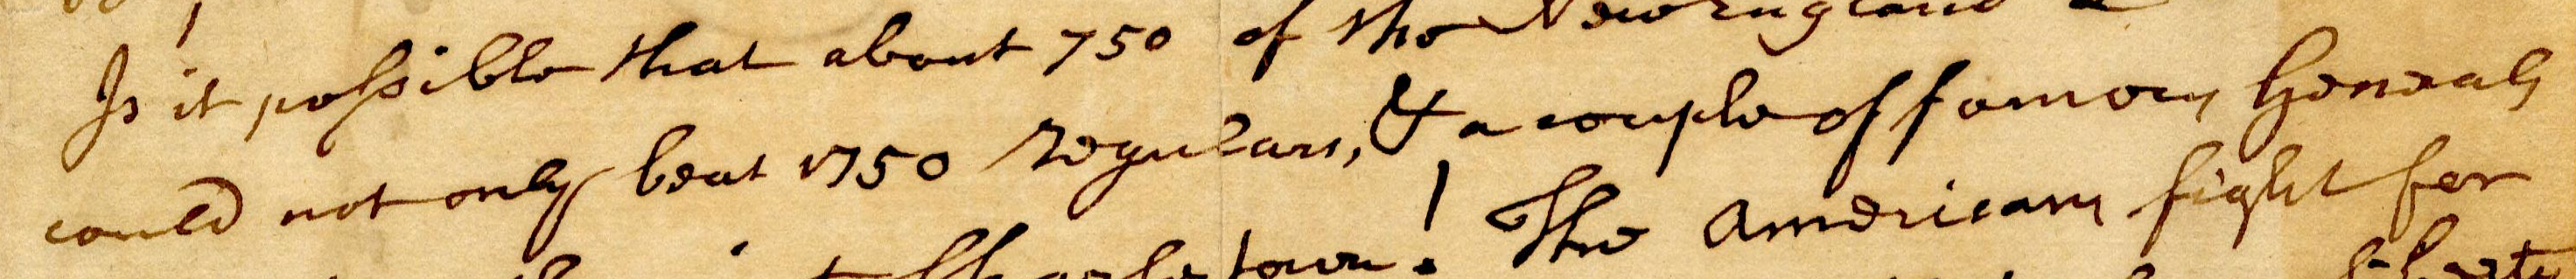could not only beat 750 Regulars, & a couple of famous Genrals
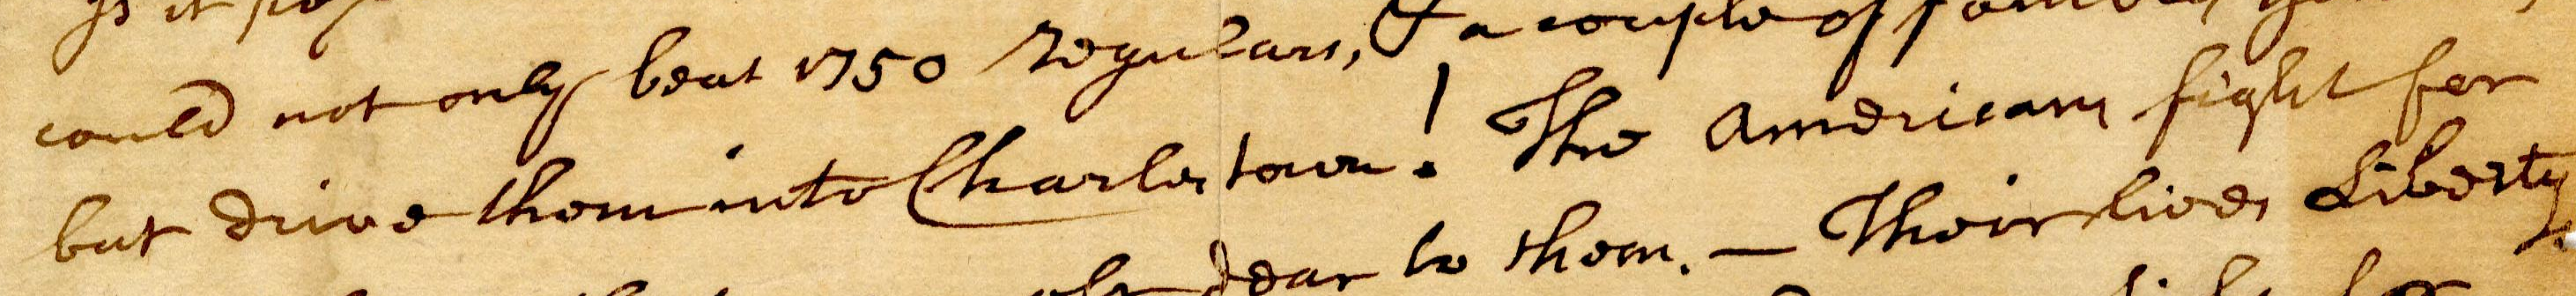but drive them into Charlestown! The Americans fight for
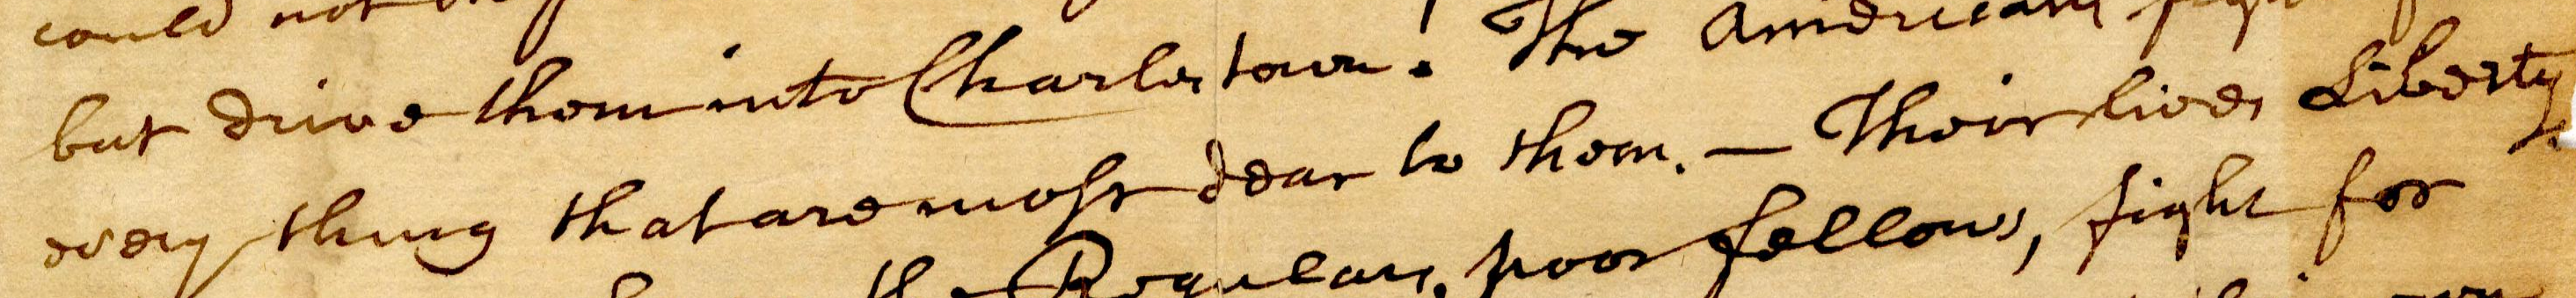every thing that are most dear to them.- Their lives, Liberty
